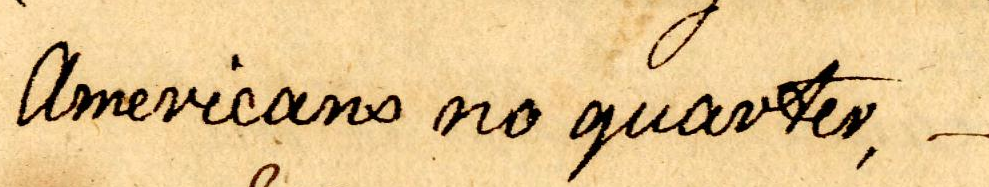Americans no quarter, -
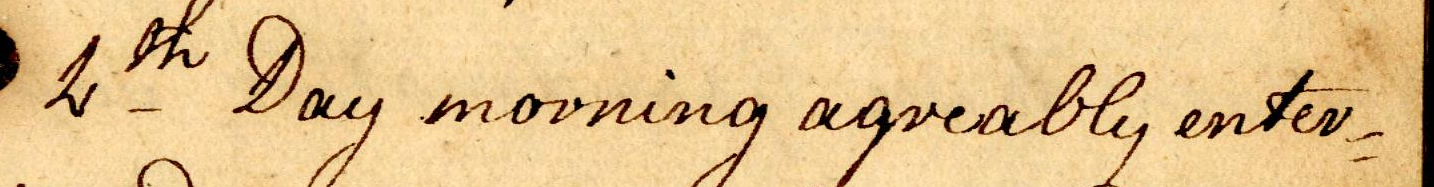4^th Day morning agreably enter-
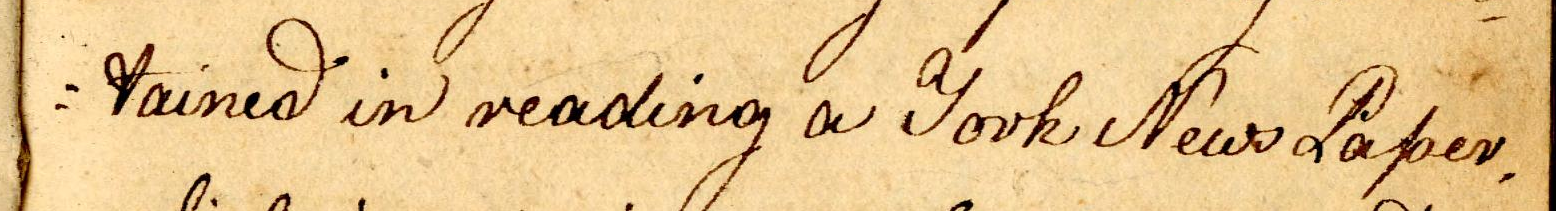-tained in reading a York News Paper,
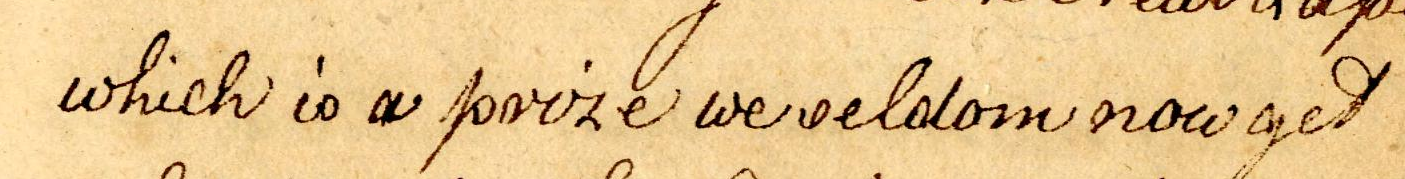which is a prize we seldom now get
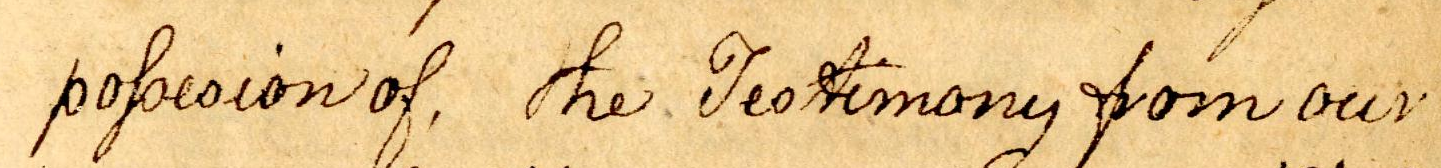possesion of, the Testimony from our
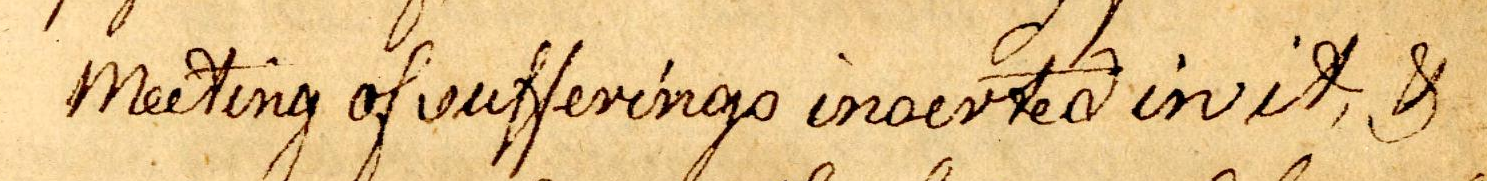Meeting of sufferings inserted in it, &
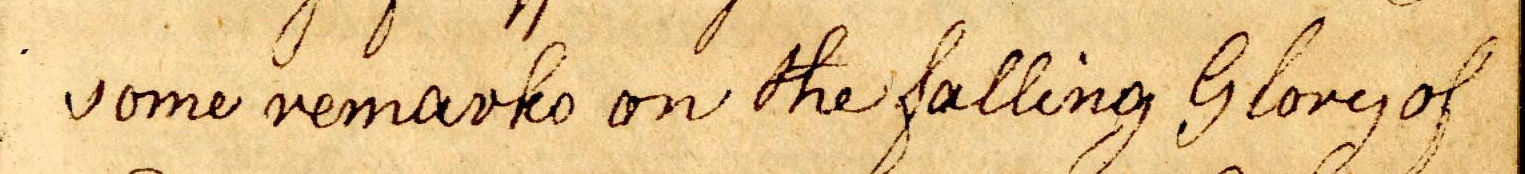some remarks on the falling Glory of
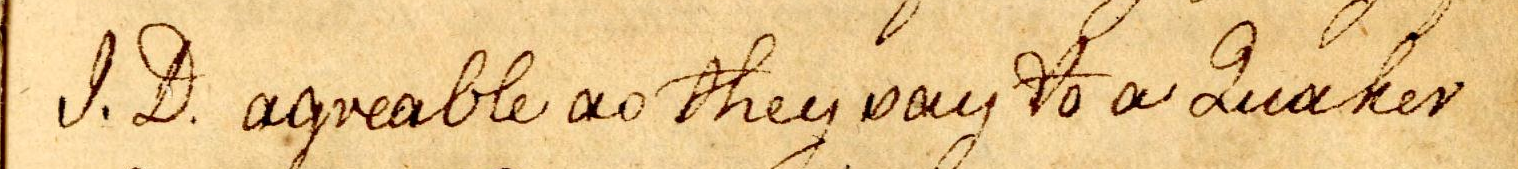J. D. agreable as they say to a Quaker
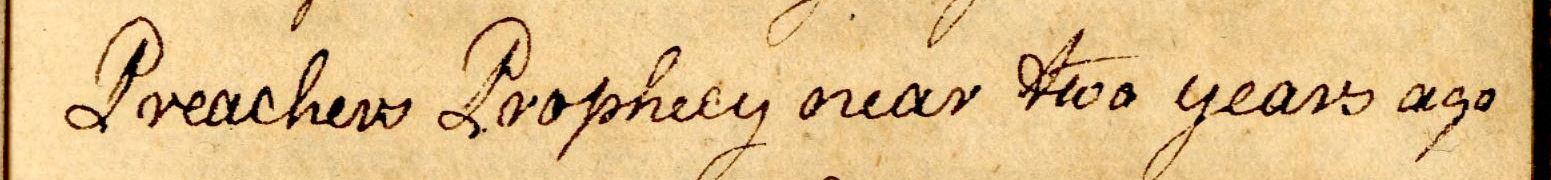Preachers Prophecy near two years ago
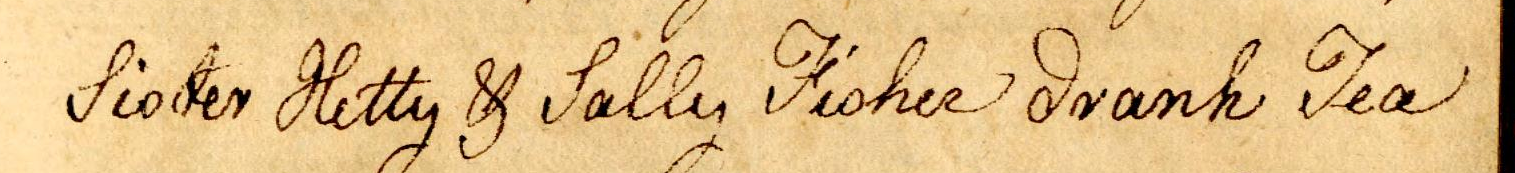Sister Hetty & Sally Fisher drank Tea
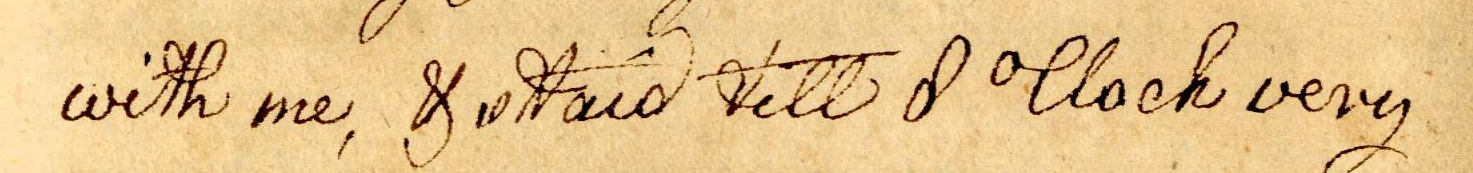with me, & staid till 8 ^oClock very
